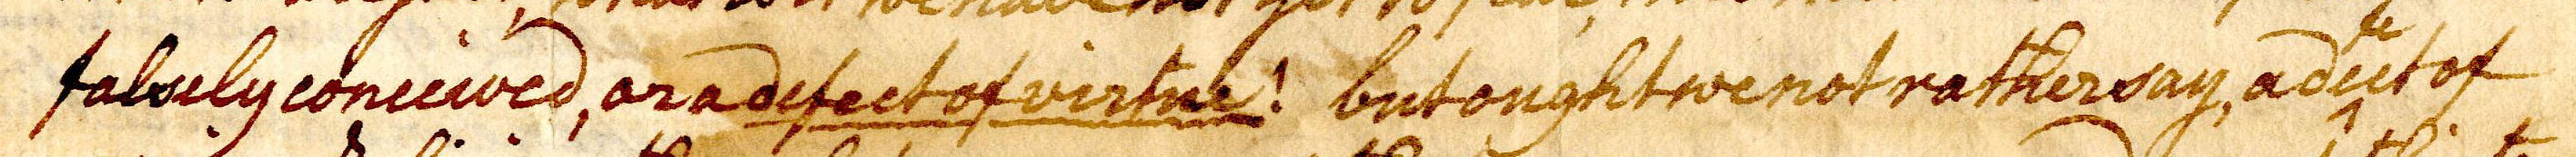falsely conceived, or a defect of virtue! but ought we not rather say, a de ^ ct of
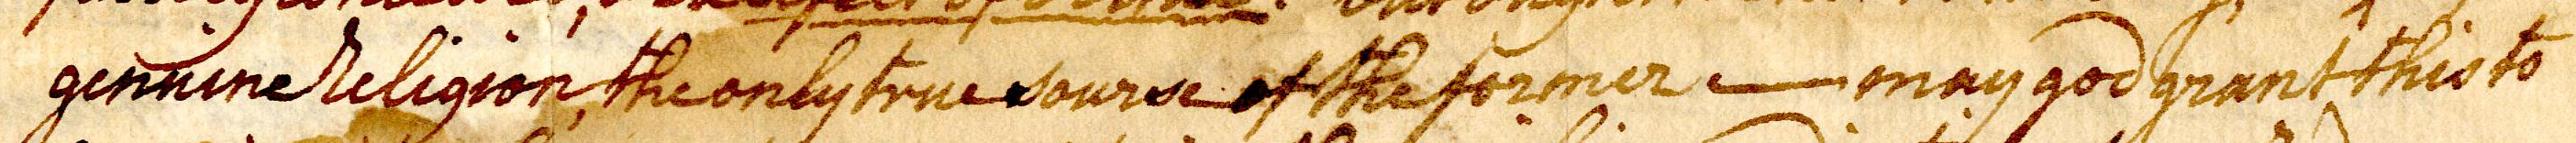genuine religion, the only true sourse of the former- may god grant this to
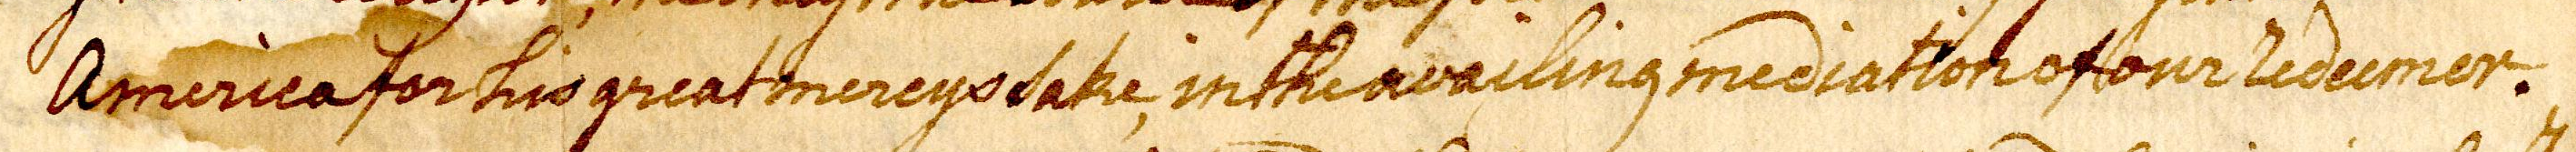America for his great mercys sake, in the availing mediation of our redeemer.
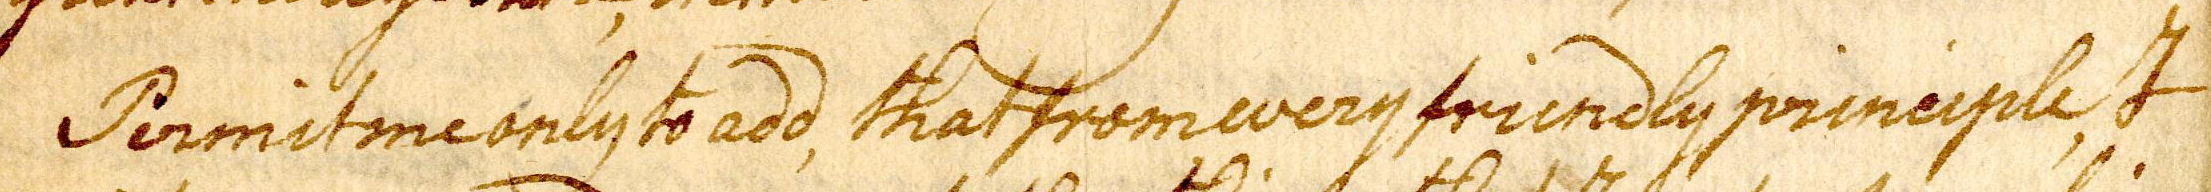Permit me only to add, that from every friendly principle, I
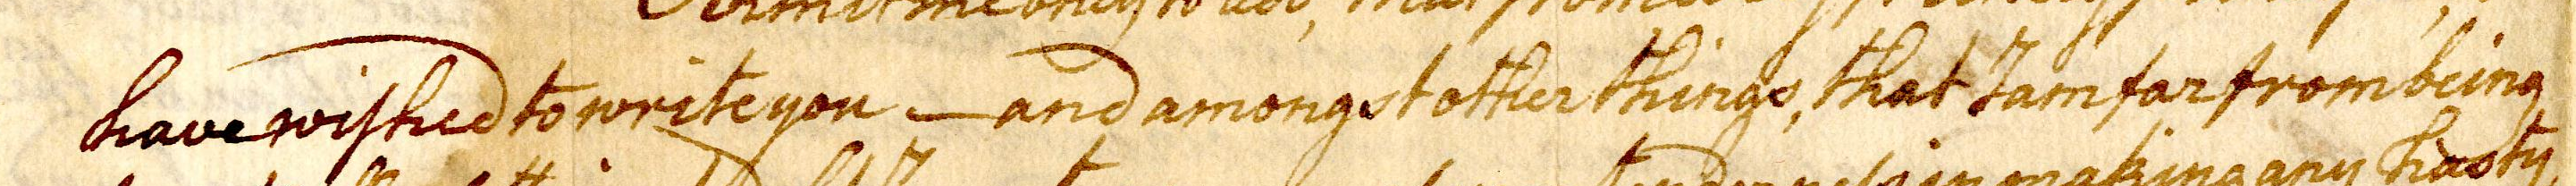have wished to write you- and amongst other things, that I am far from being
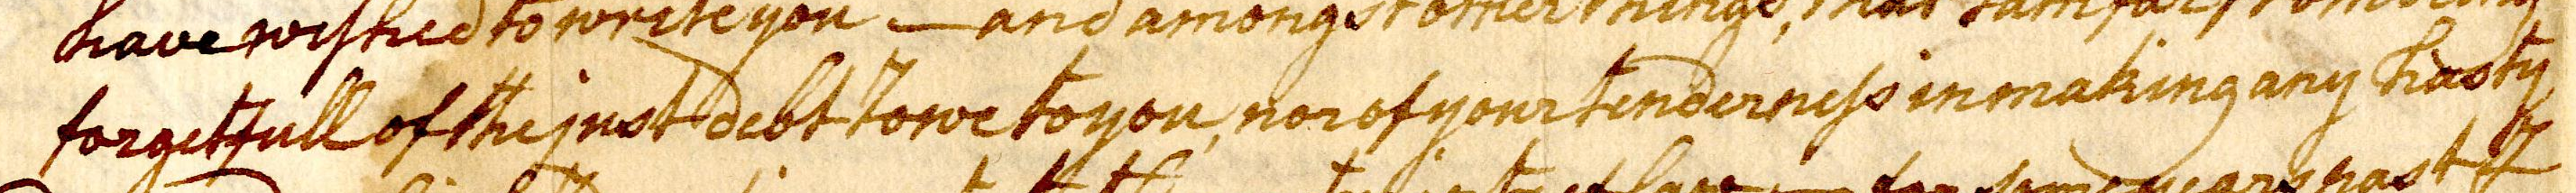forgetfull of the just debt I owe to you, nor of your tenderness in making any hasty
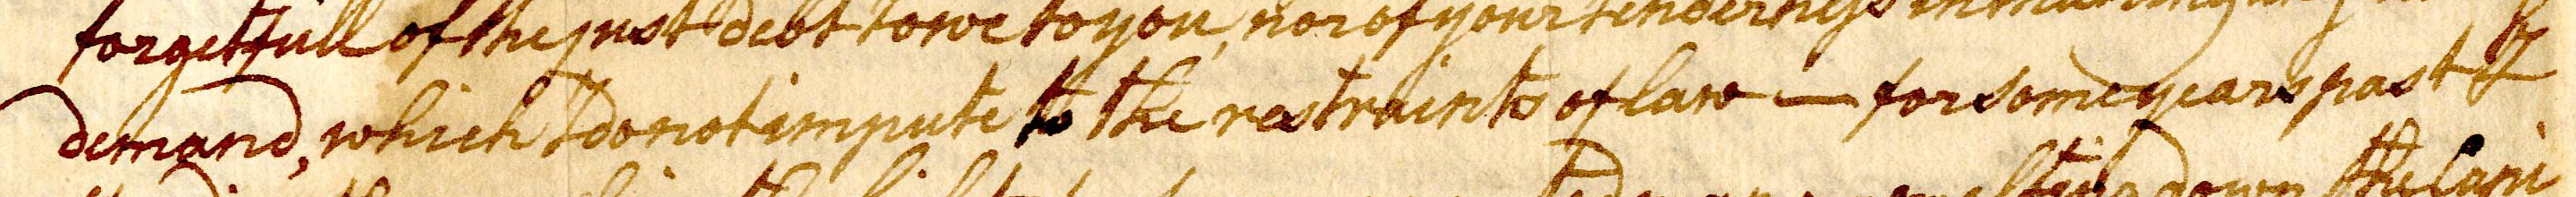demand, which I do not impute to the restraints of law- for some years past I
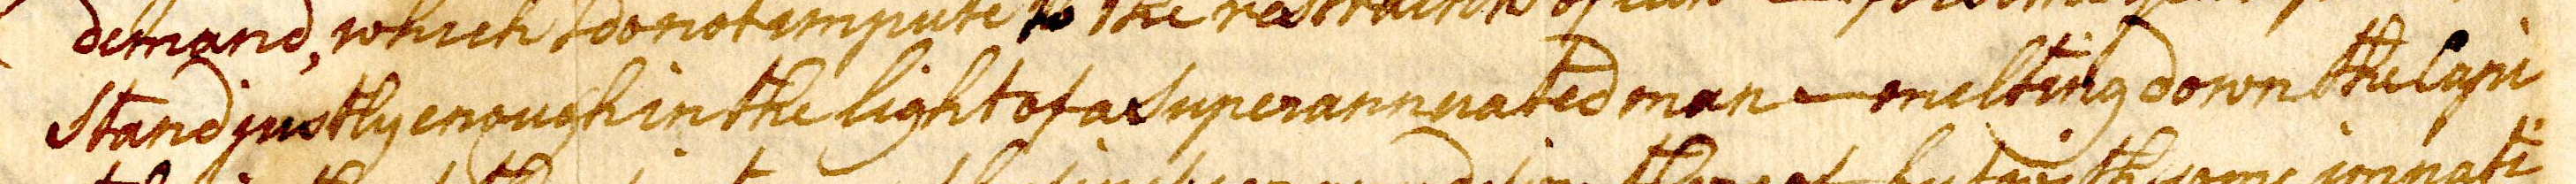stand justly enough in the light of a superannuated man- melting down the Capi
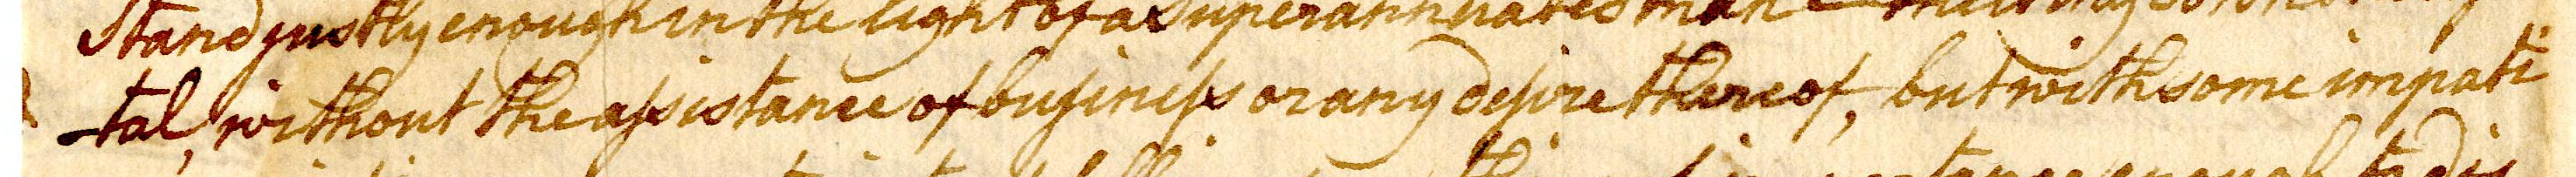-tal, without the assistance of business or any desire threof, but with some impati
